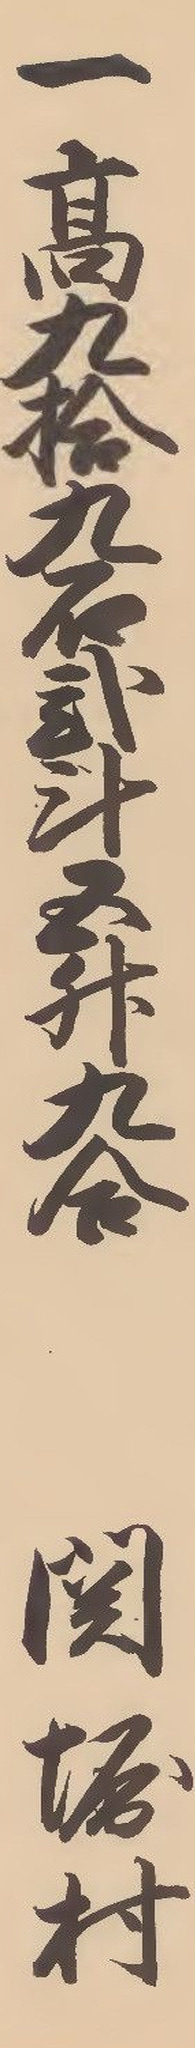一高九拾九石弐斗五升九合関堀村
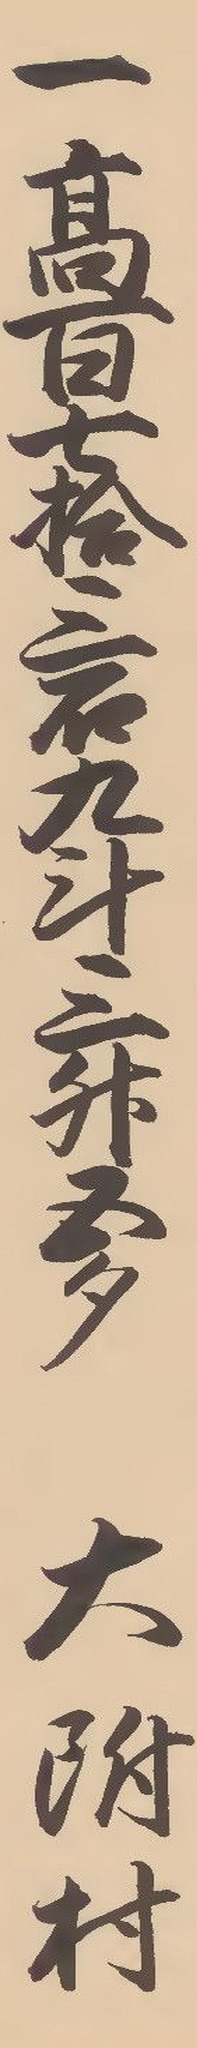一高百七拾三石九斗三升五勺大附村
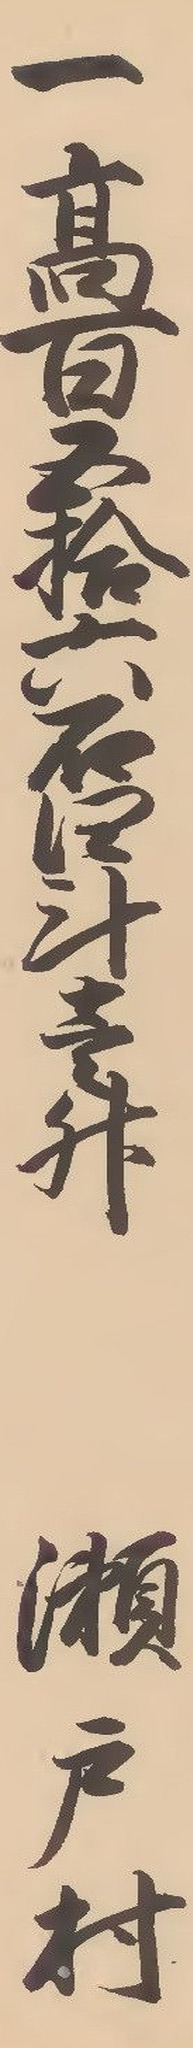一高百五拾六石四斗壱升瀬戸村
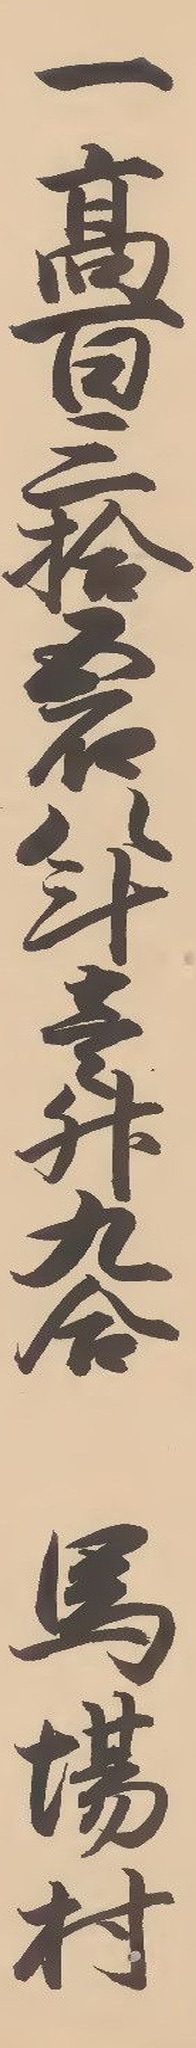一高百三拾五石八斗壱升九合馬場村
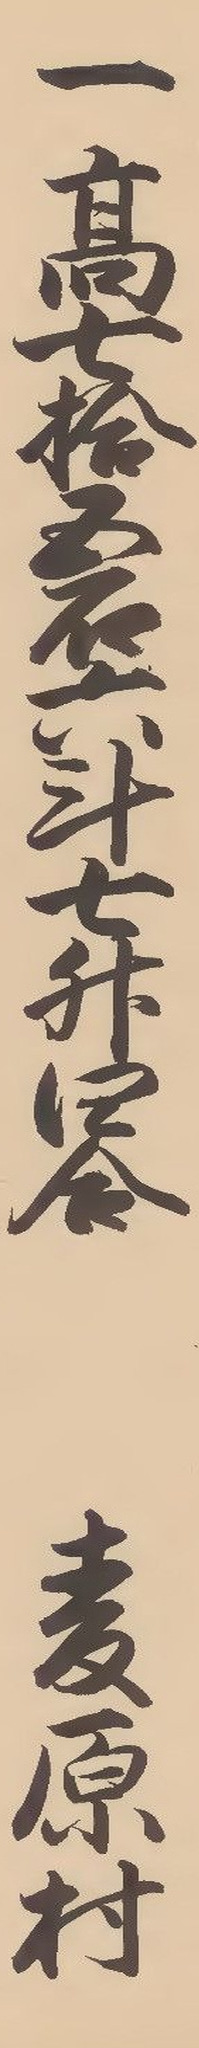一高七拾五石六斗七升四合麦原村
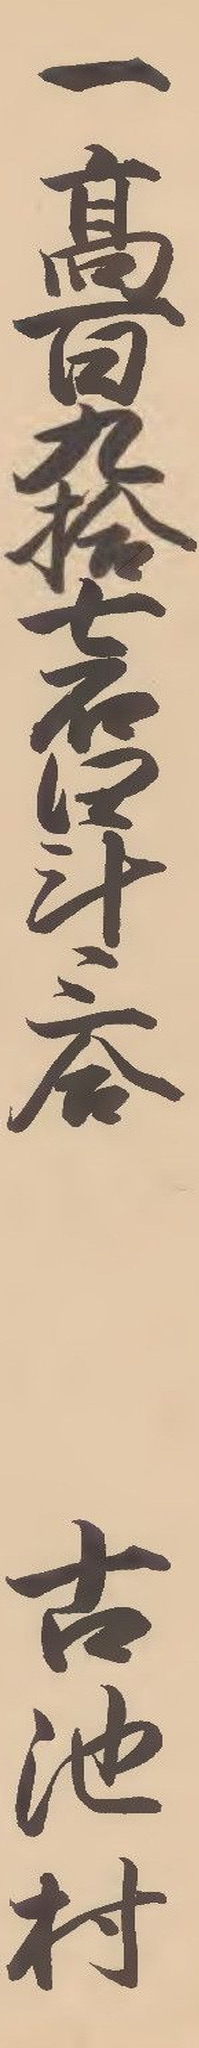一高百九拾七石四斗三合古池村
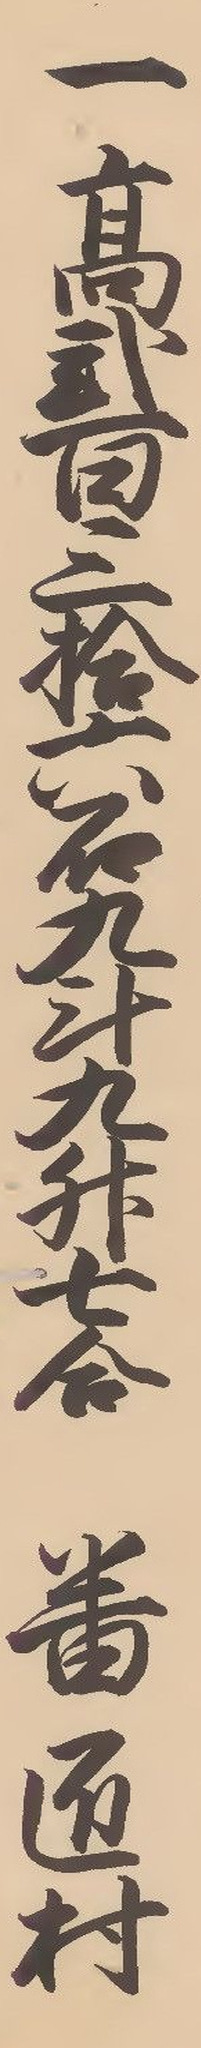一高弐百三拾六石九斗九升七合番匠村

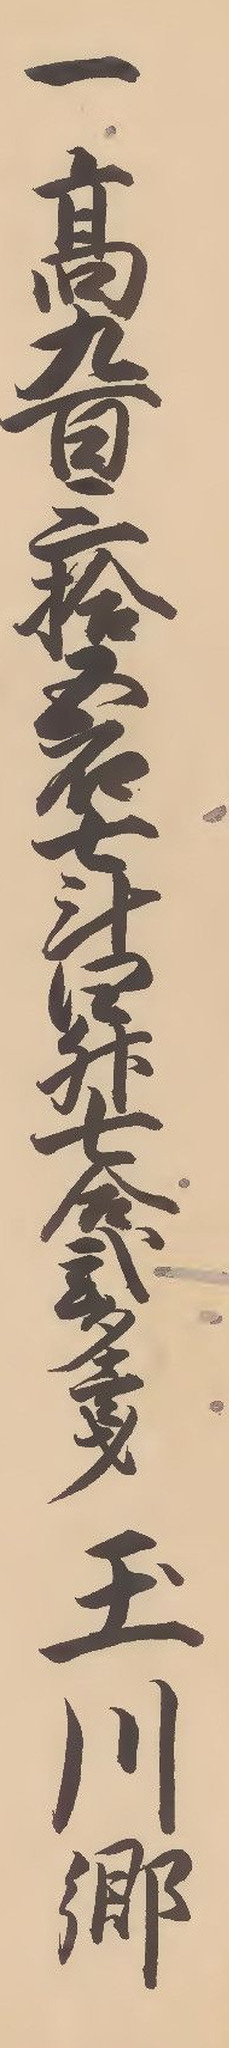一高九百三拾五石七斗四升七合弐勺壱才玉川郷
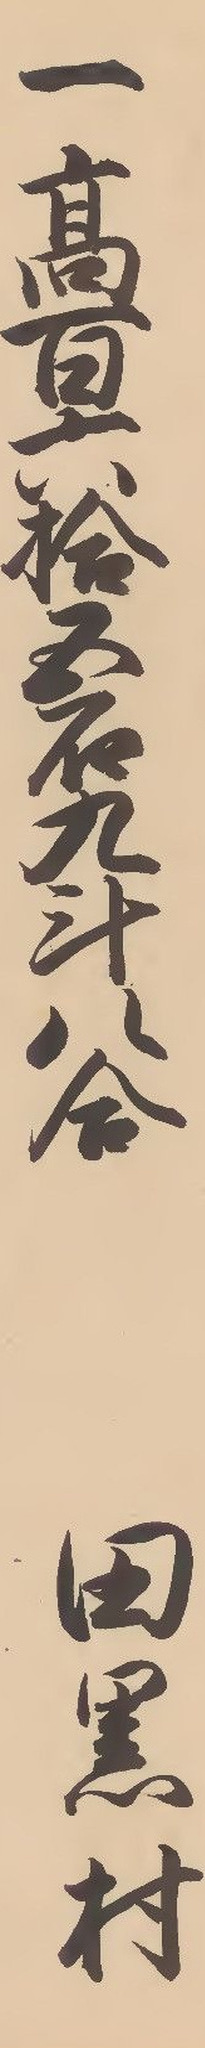一高百六拾五石九斗八合田黒村
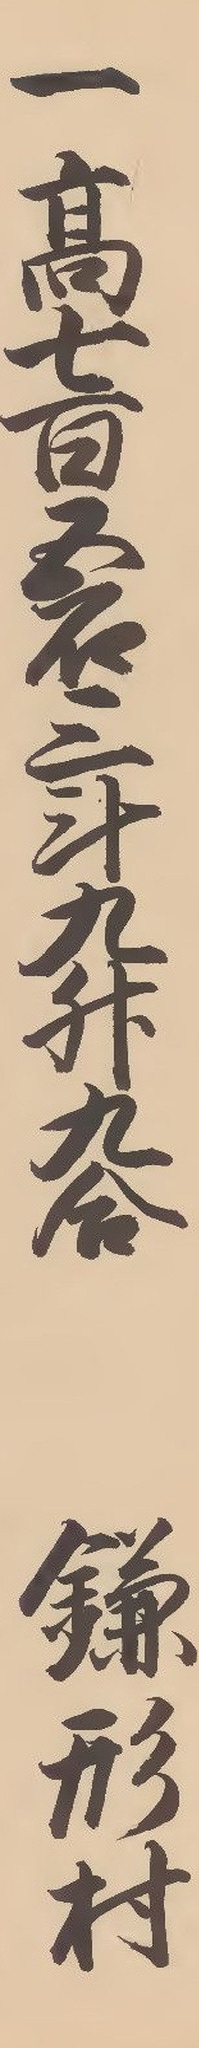一高七百五石三斗九升九合鎌形村
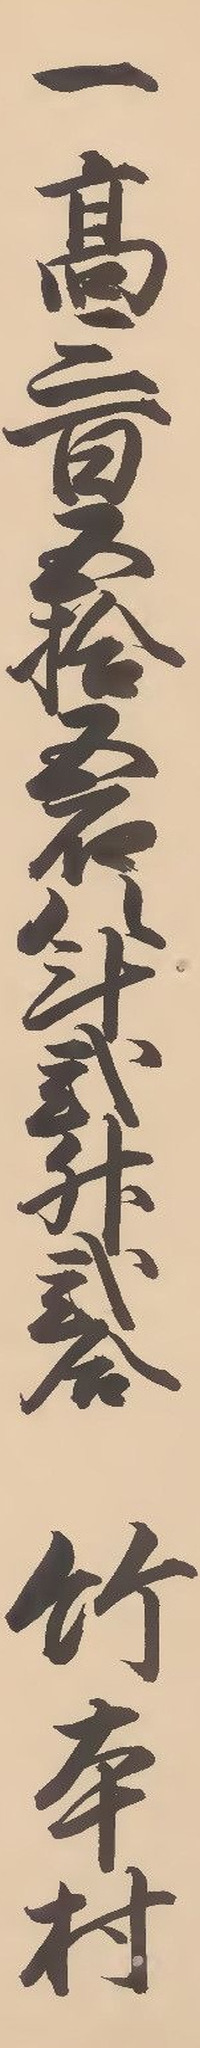一高三百五拾五石八斗弐升弐合竹本村
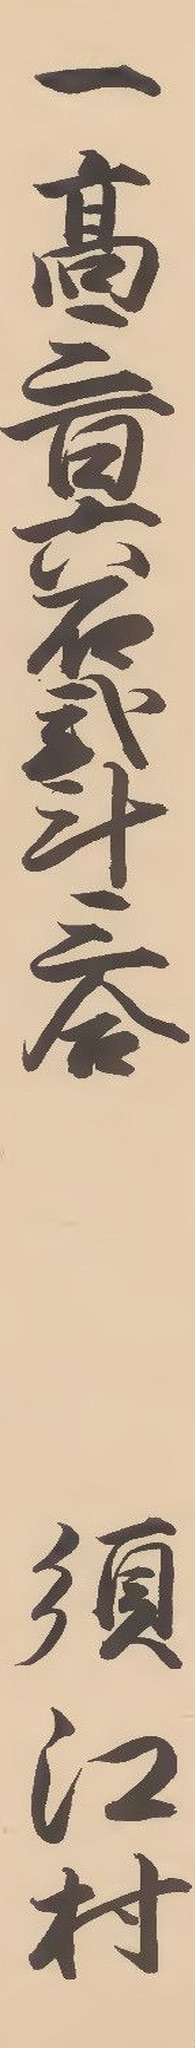一高三百六石弐斗三合須江村
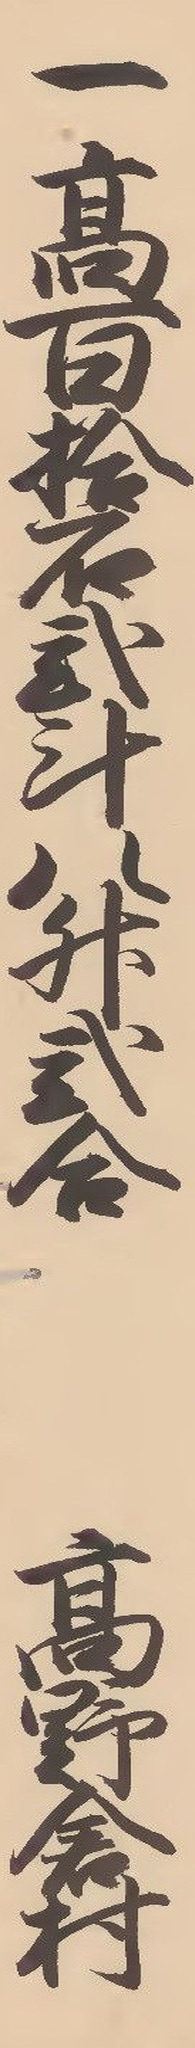一高百拾石弐斗八升弐合高野倉村

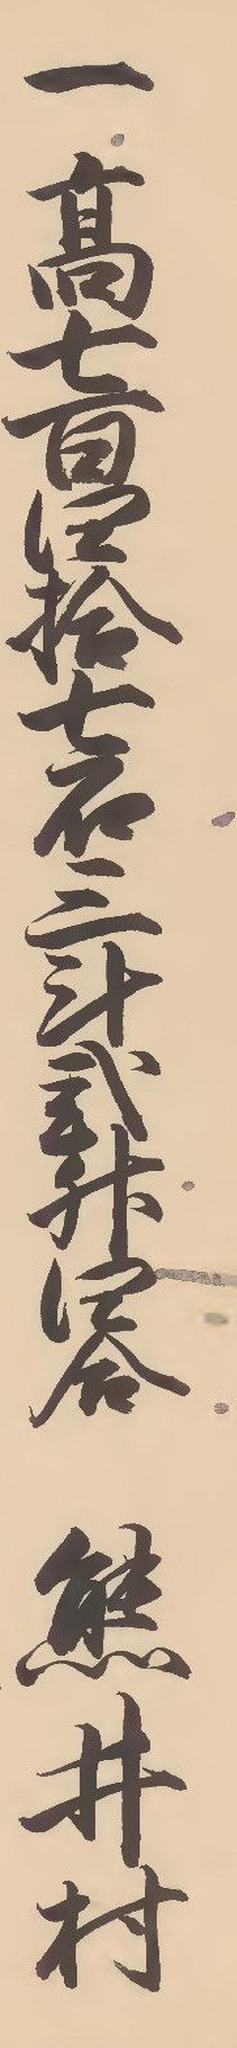一高七百四拾七石三斗弐升四合熊井村
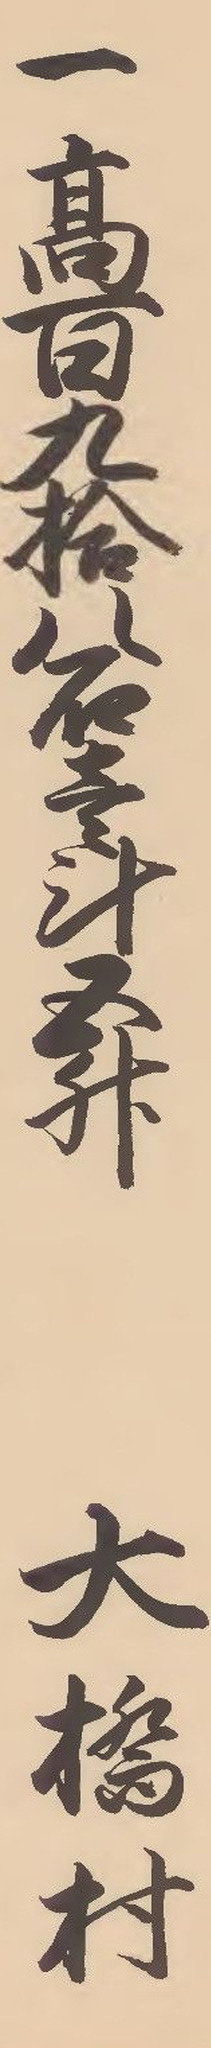一高百九拾八石壱斗五升大橋村
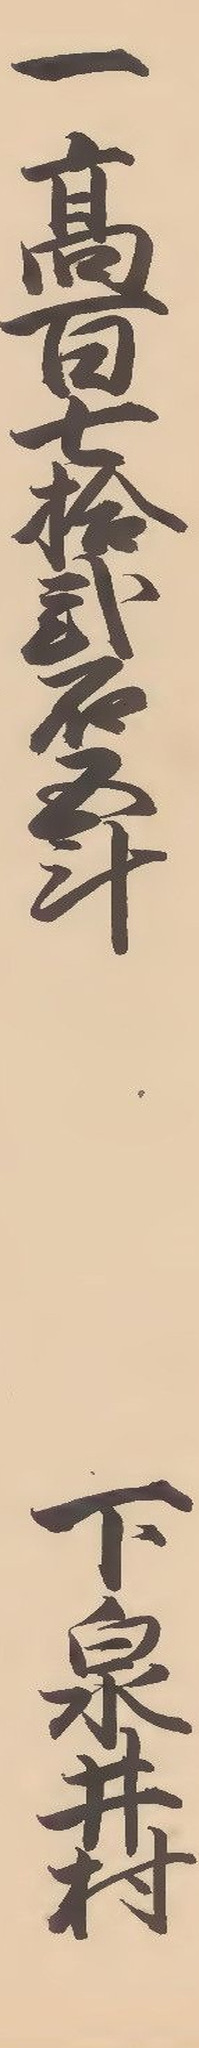一高百七拾弐石五斗下泉井村
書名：武蔵国郷帳　下
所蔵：国立公文書館 National Archives of Japan
